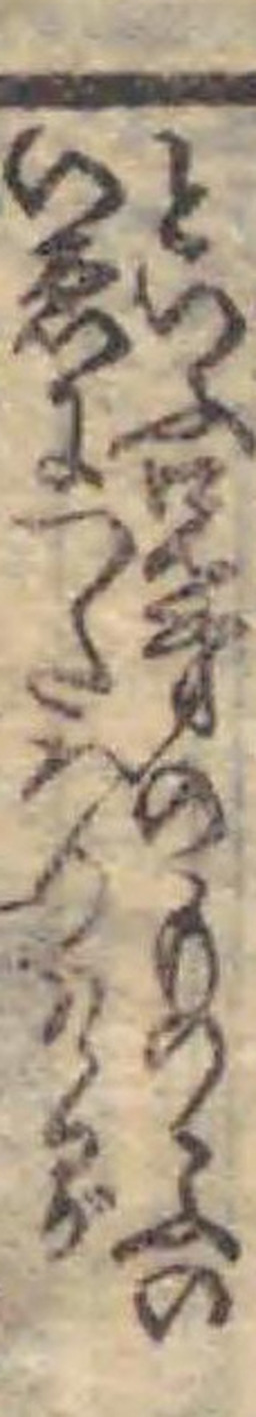いゑにつたはりけるが
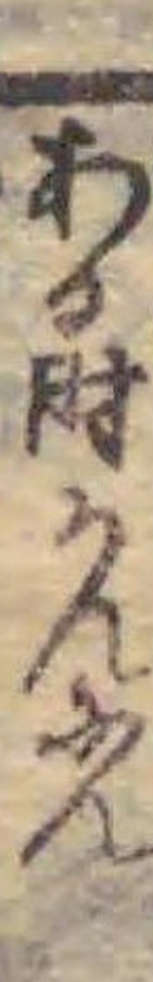ある時かんにん
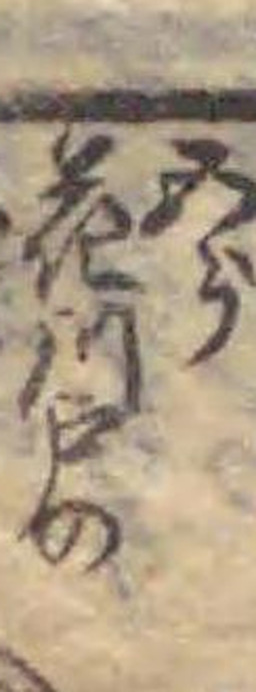花川戸の
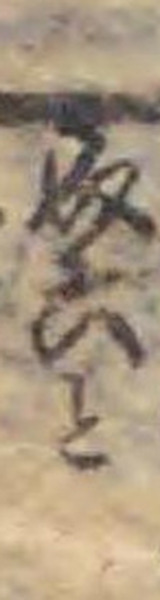介六と
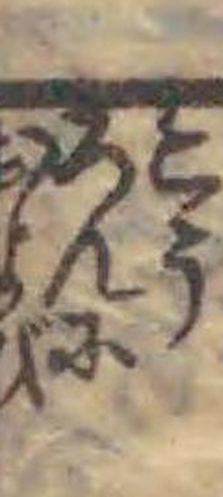および
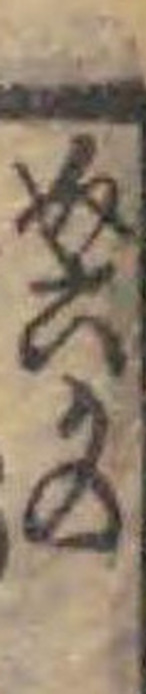介六かの
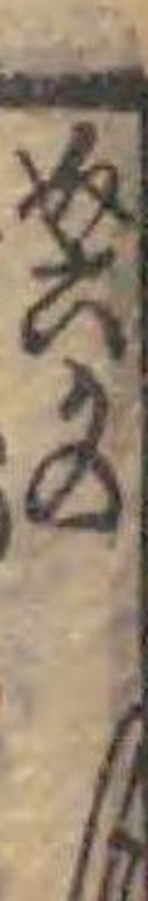介六かの
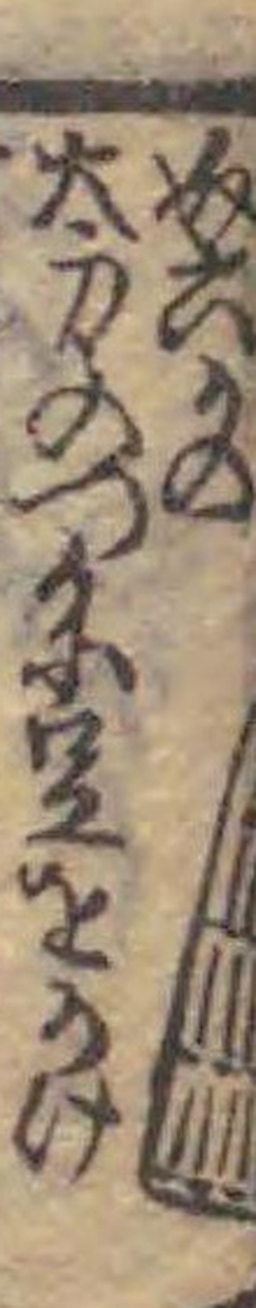太刀のつかに足をかけ
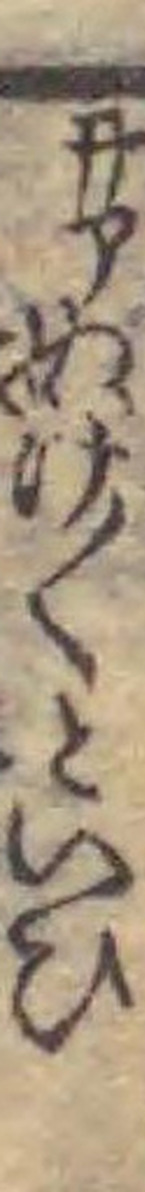サアぬけ〳〵といひ
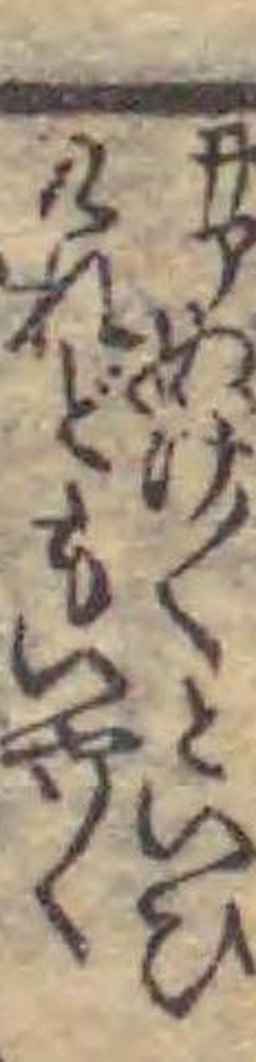けれどもいや〳〵
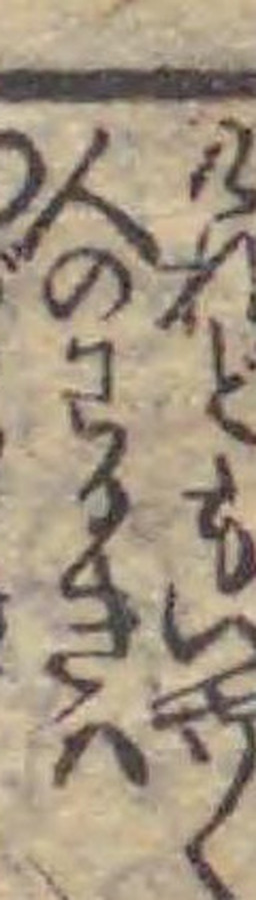人のわるきは
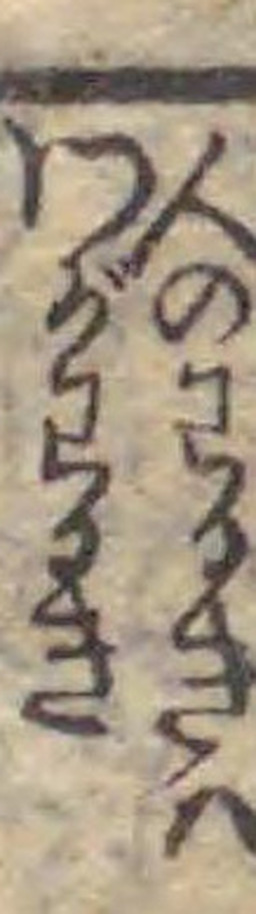わがわるき
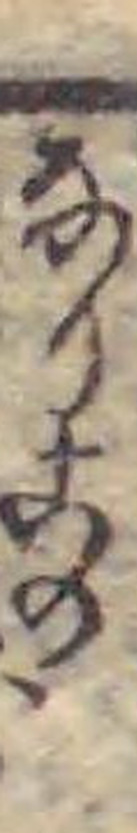なりこの
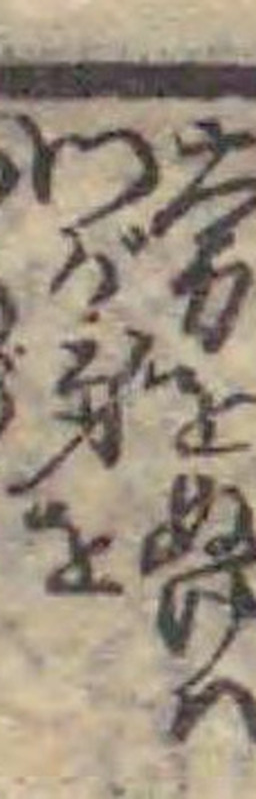わが身を
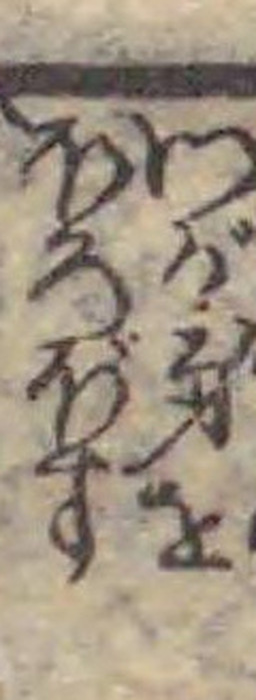ほろぼす
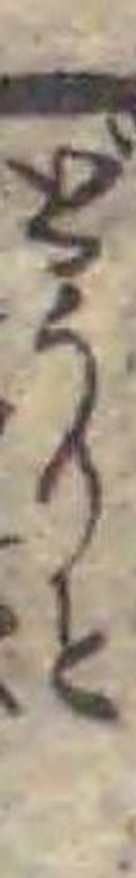どうりと
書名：身体開帳略縁起 : 3巻
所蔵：国立国会図書館 National Diet Library, JAPAN
